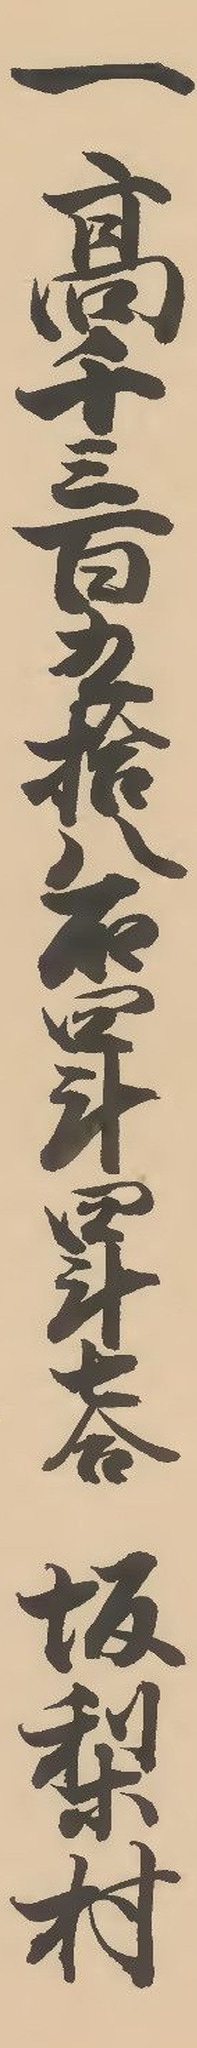一髙千三百九拾八石四斗四升七合坂梨村
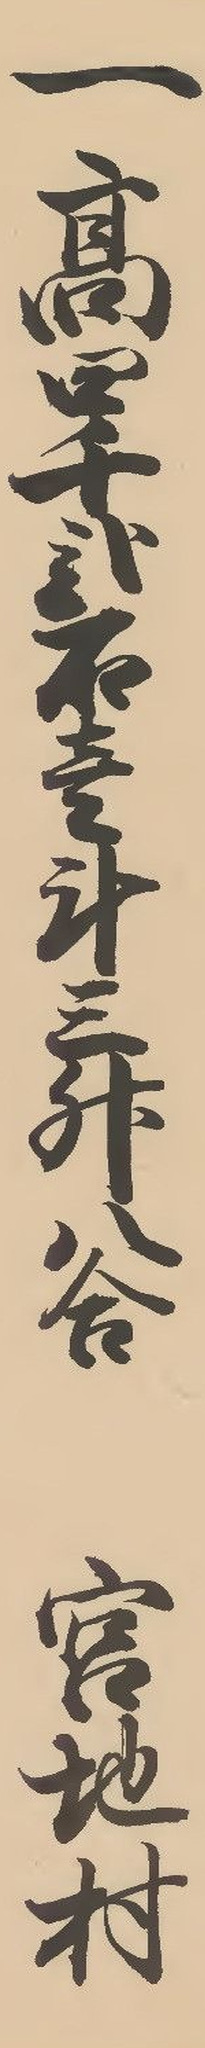一髙四千弐石壱斗三升八合宮地村
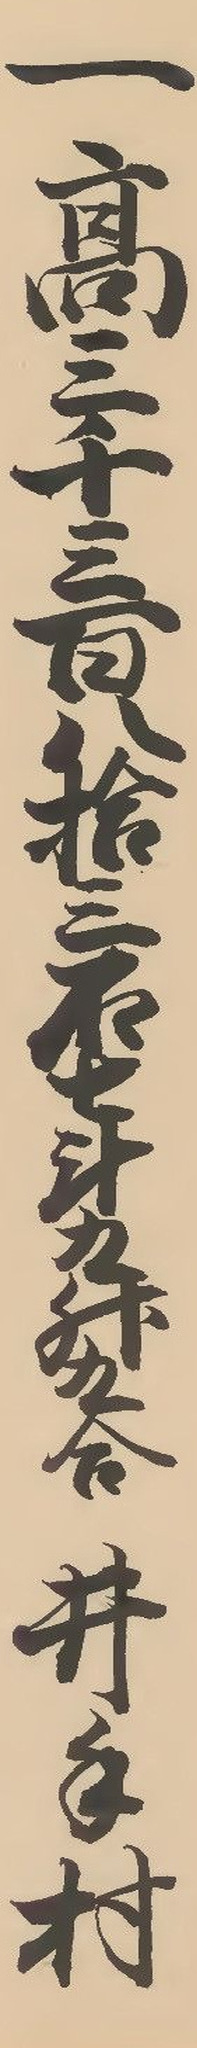一髙三千三百八拾三石七斗九升九合井手村
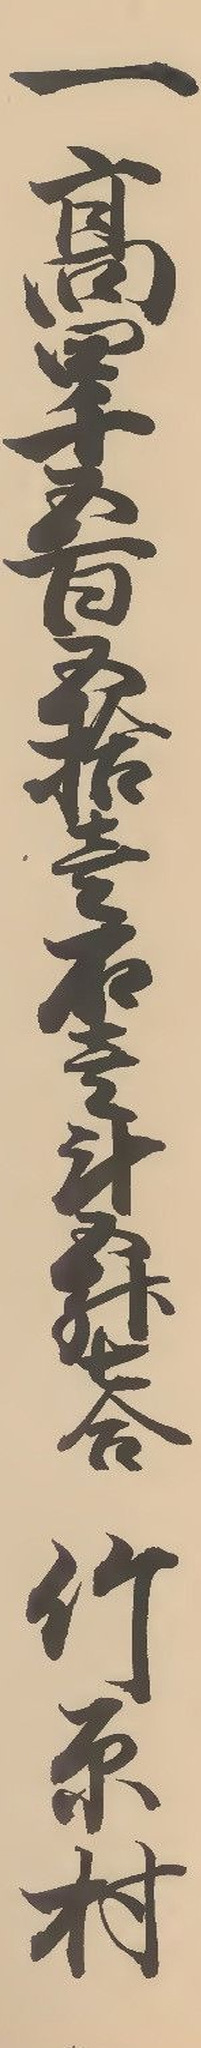一髙四千五百五拾壱石壱斗五升七合竹原村
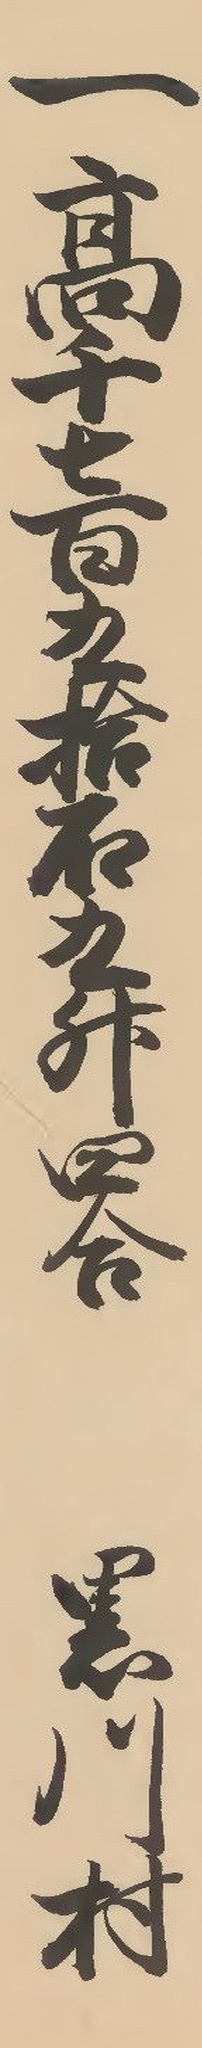一髙千七百九拾石九升四合黑川村
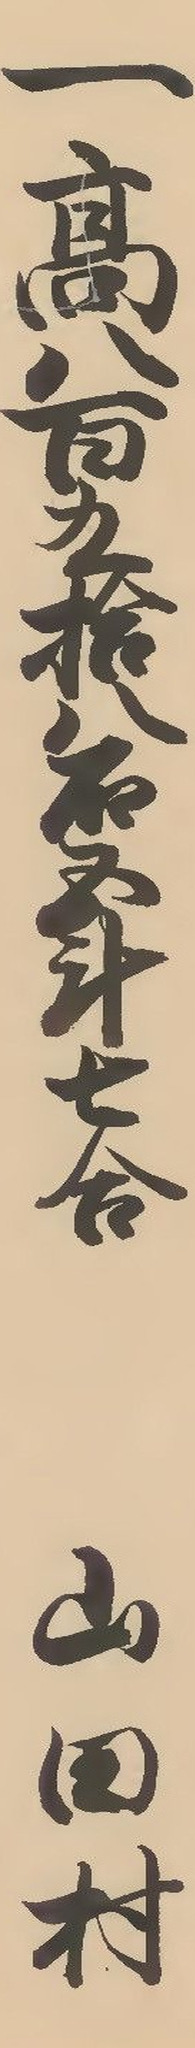一髙八百九拾八石五斗七合山田村
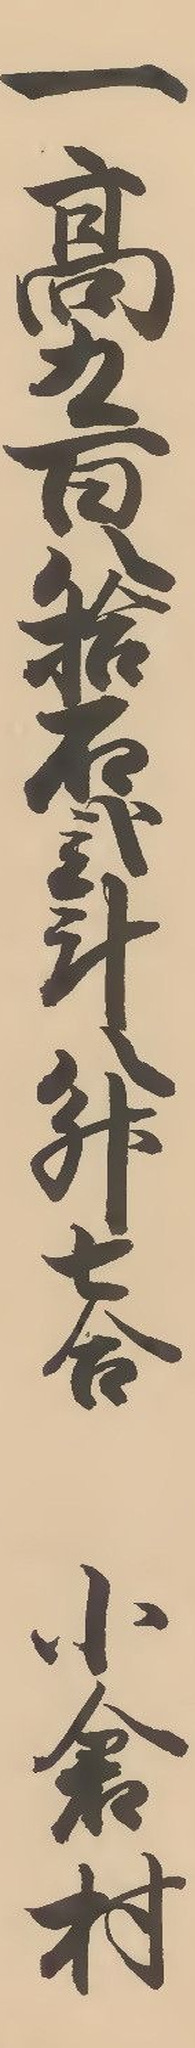一髙九百八拾石弐斗八升七合小倉村
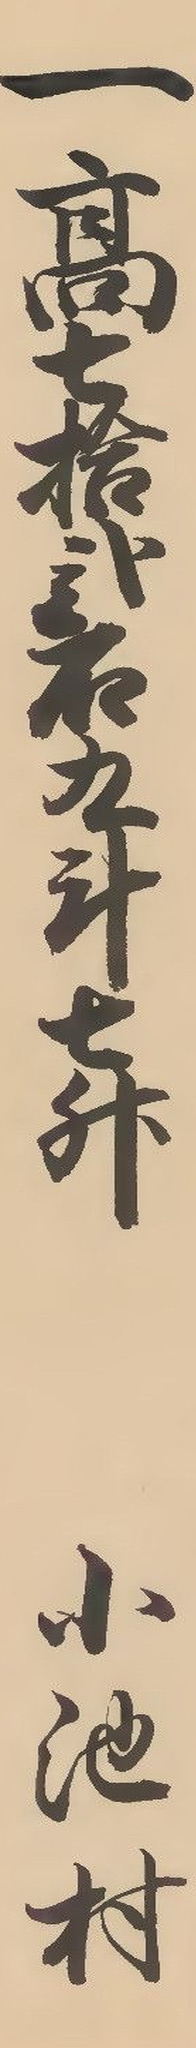一髙七拾弐石九斗七升小池村

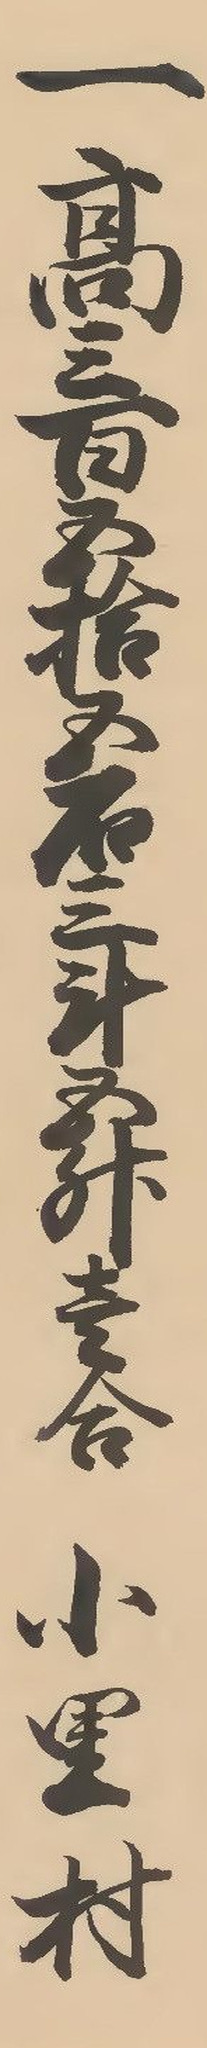一髙三百五拾五石三斗五升壱合小里村
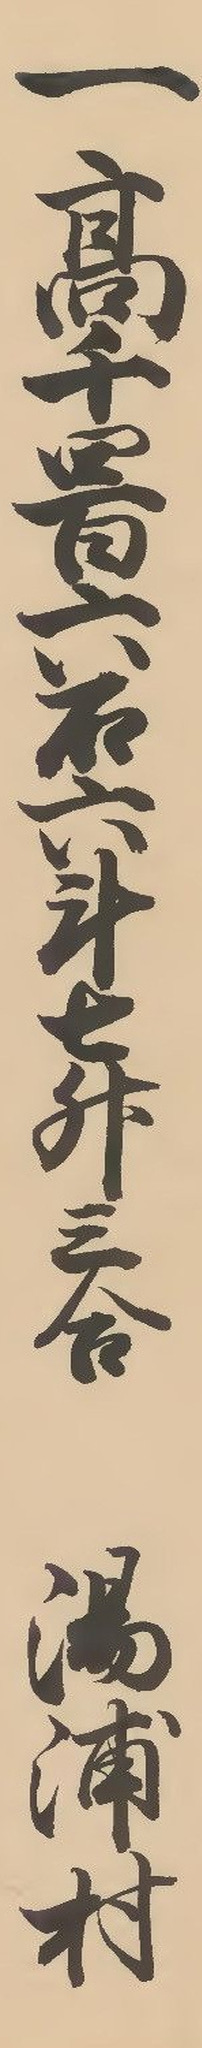一髙千四百六石六斗七升三合湯浦村
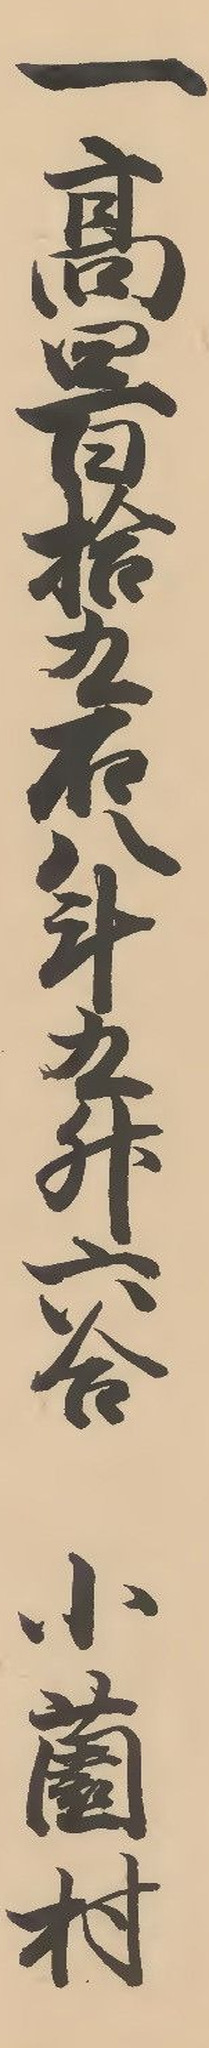一髙四百拾九石八斗九升六合小薗村
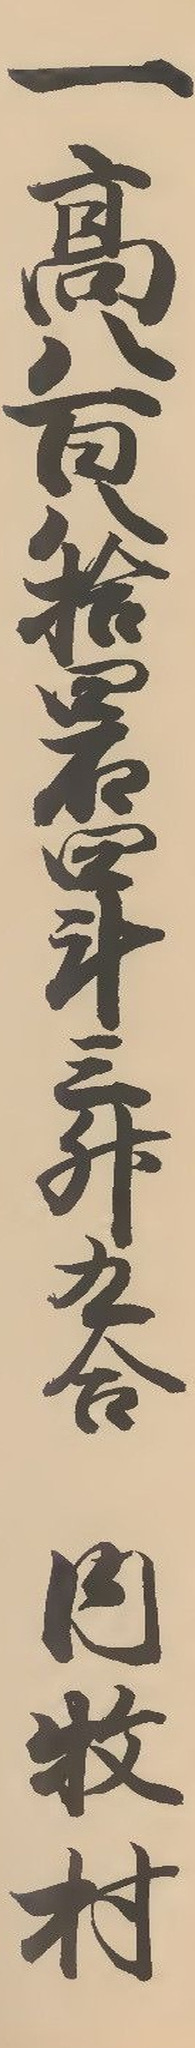一髙八百八拾四石四斗三升九合内牧村
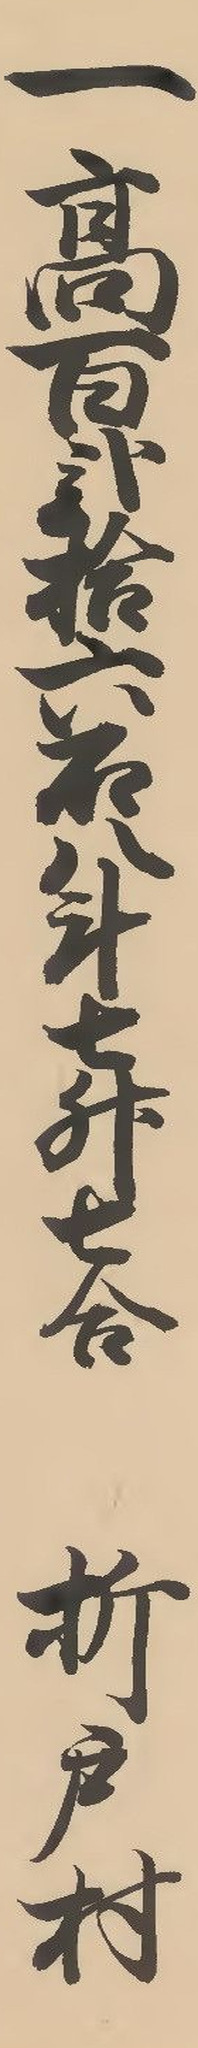一髙百弐拾六石八斗七升七合折戸村
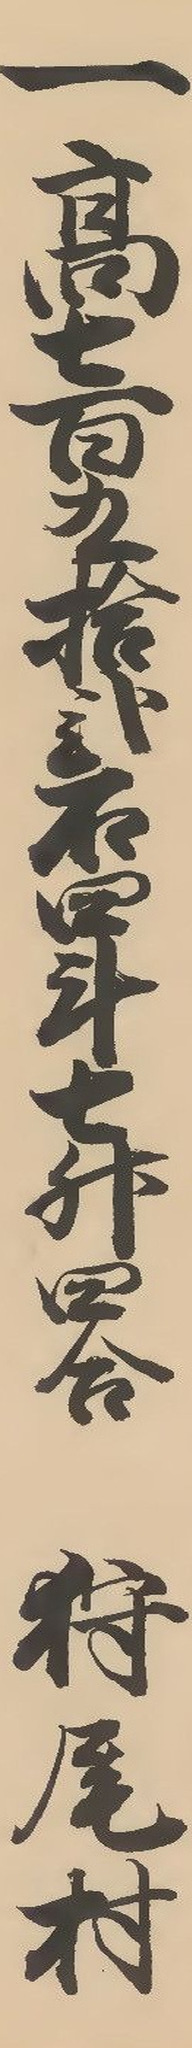一髙七百九拾弐石四斗七升四合狩尾村
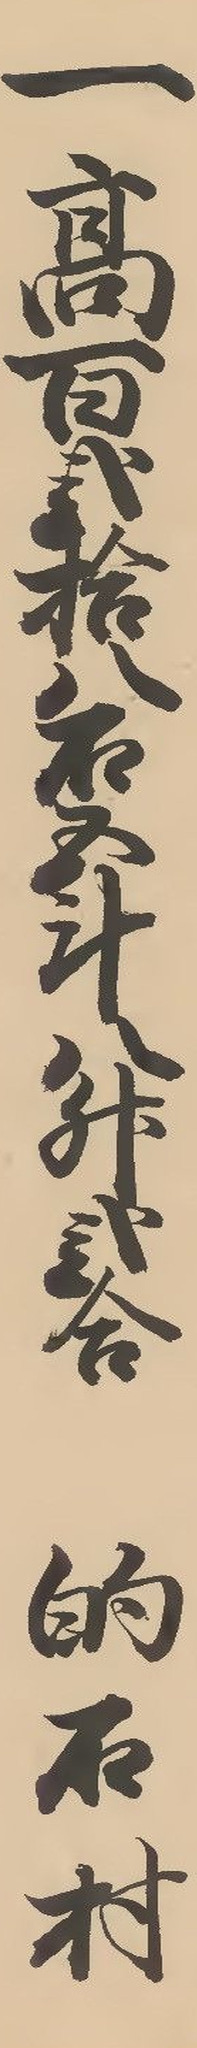一髙百弐拾八石五斗八升弐合的石村
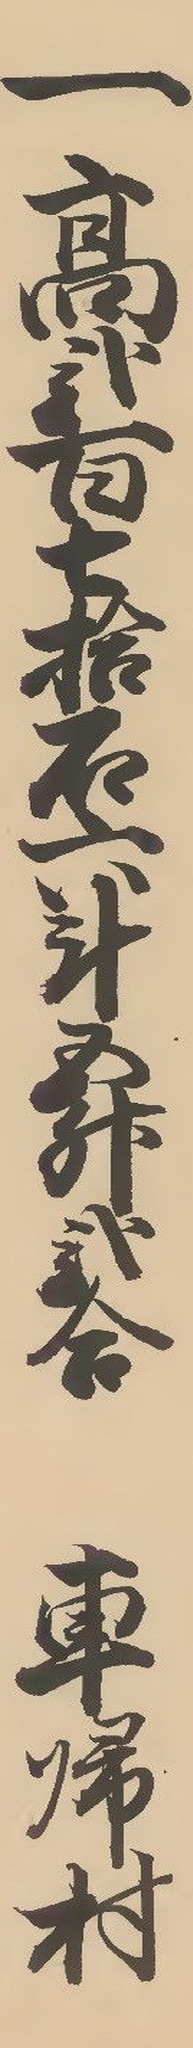一髙弐百七拾石六斗五升弐合車帰村
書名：肥後国郷帳
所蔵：国立公文書館 National Archives of Japan
